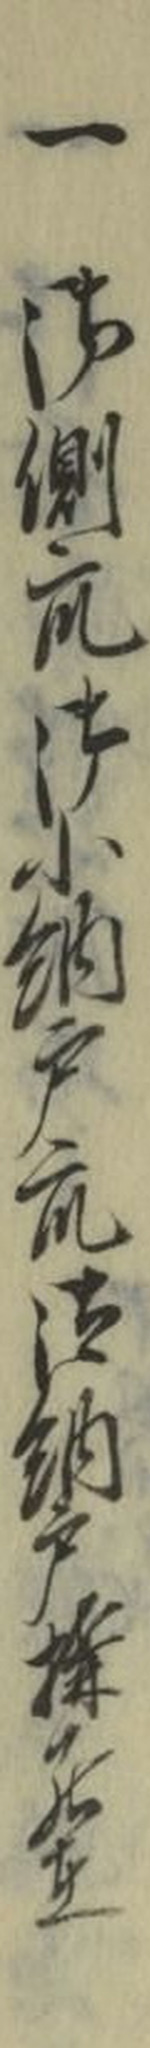一御側衆御小納戸衆御納戸構罷在
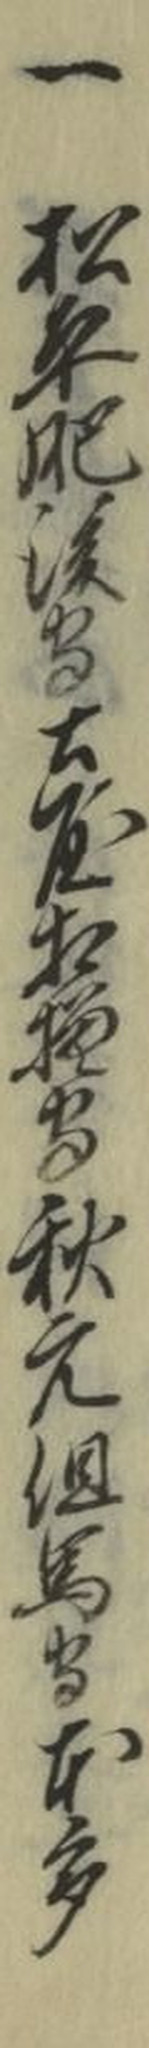一松平肥後守土屋相模守秋元但馬守本多
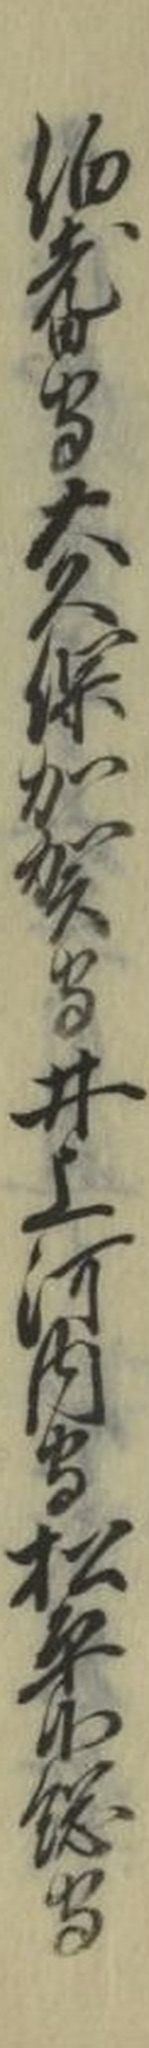伯耆守大久保加賀守井上河内守松平下総守

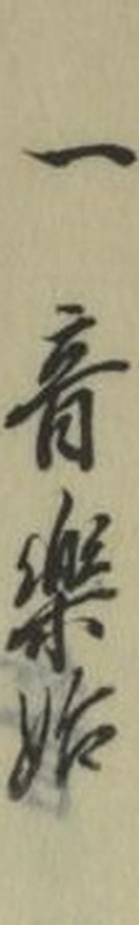一音楽始
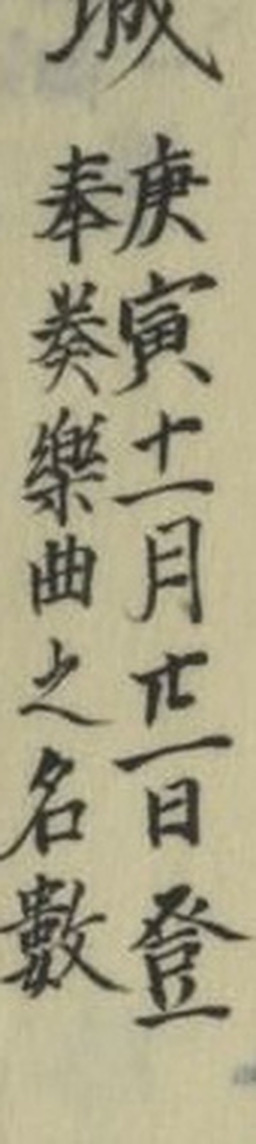奉奏樂曲之名數
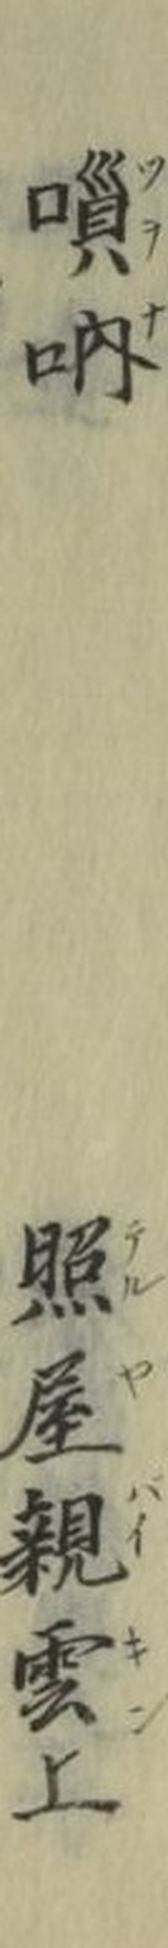吶照屋親雲上
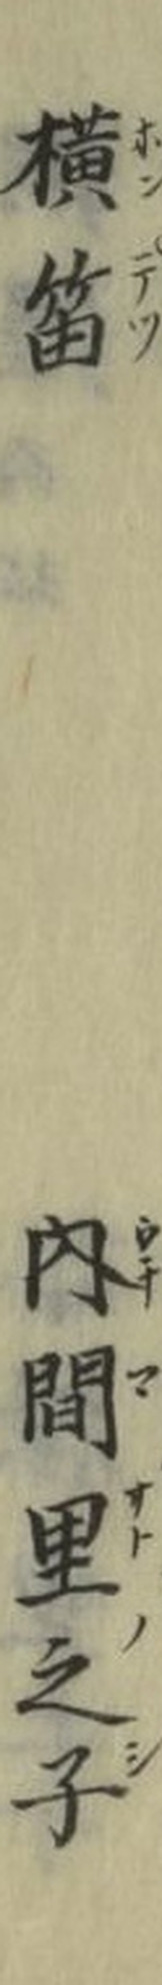横笛内間里之子

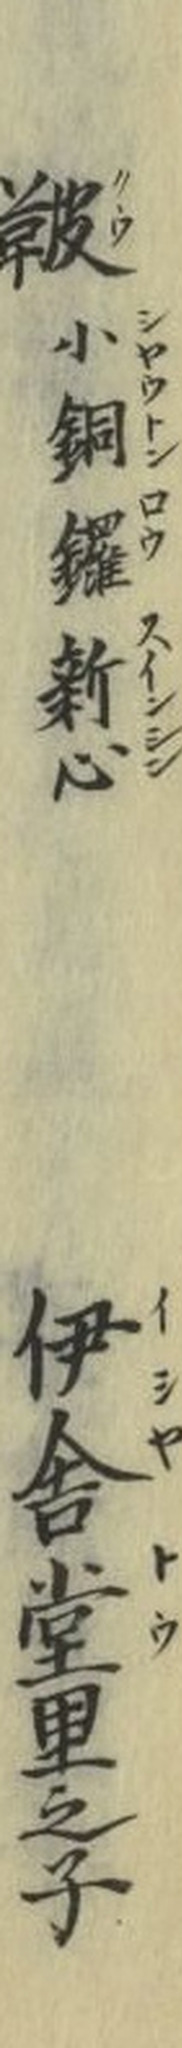鞁小銅鑼新心伊舎堂里之子
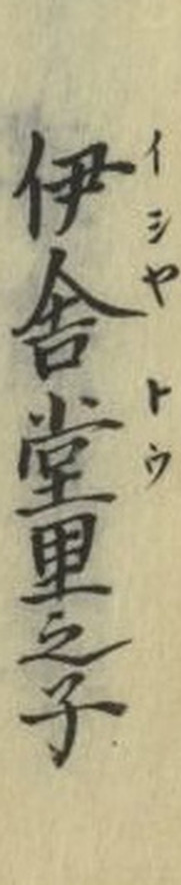管伊舎堂里之子
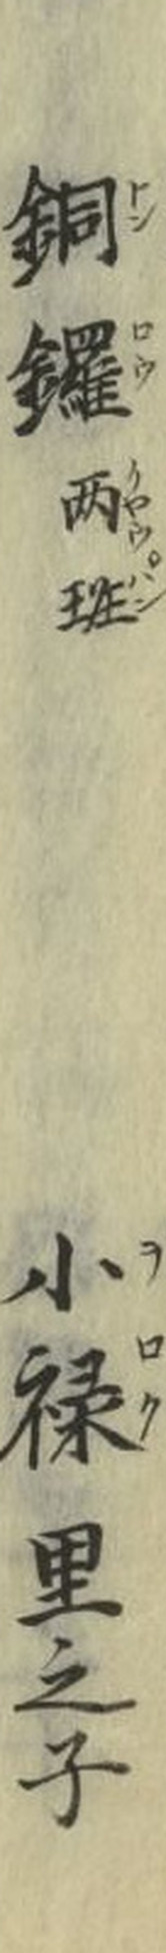銅鑼兩班小禄里之子
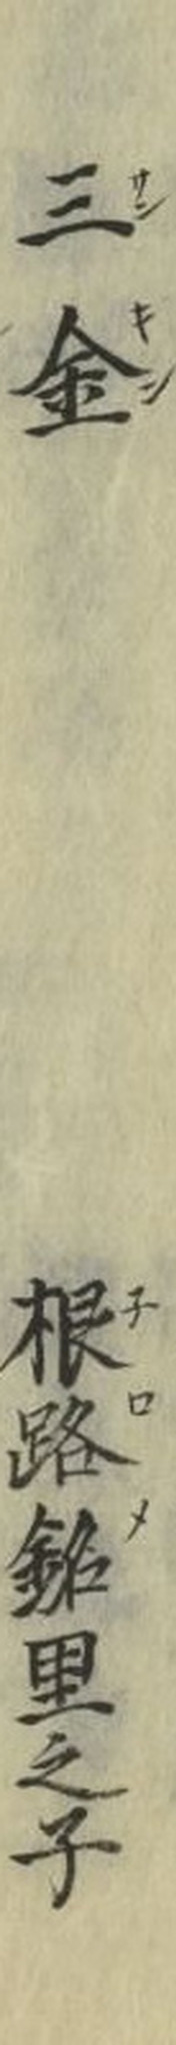三金根路銘里之子
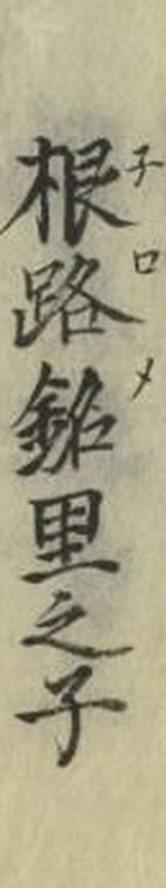三金根路銘里之子
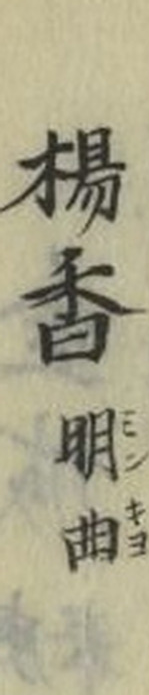楊香明曲
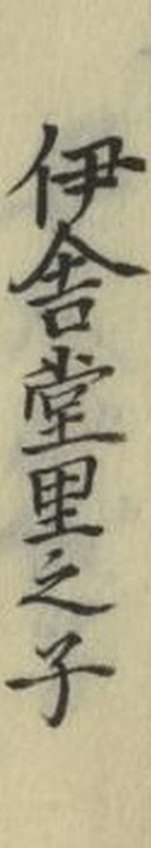管伊舎堂里之子
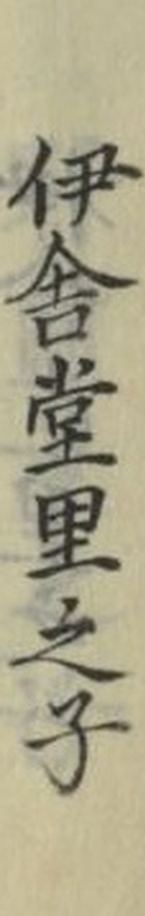管伊舎堂里之子
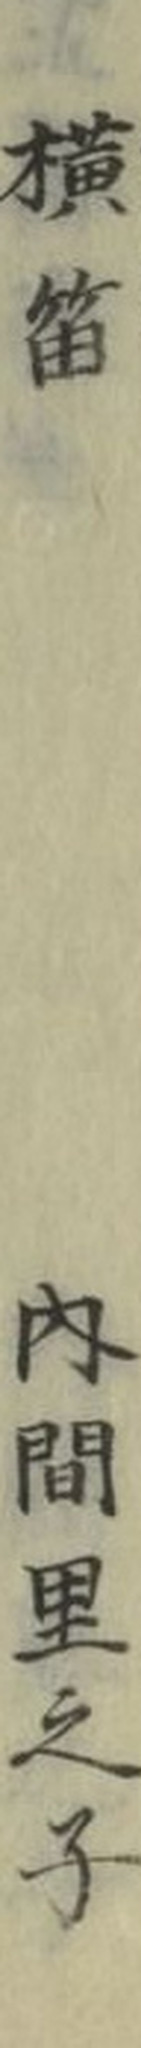横笛内間里之子
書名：琉球人参府記
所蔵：University of the Ryukyus Library
